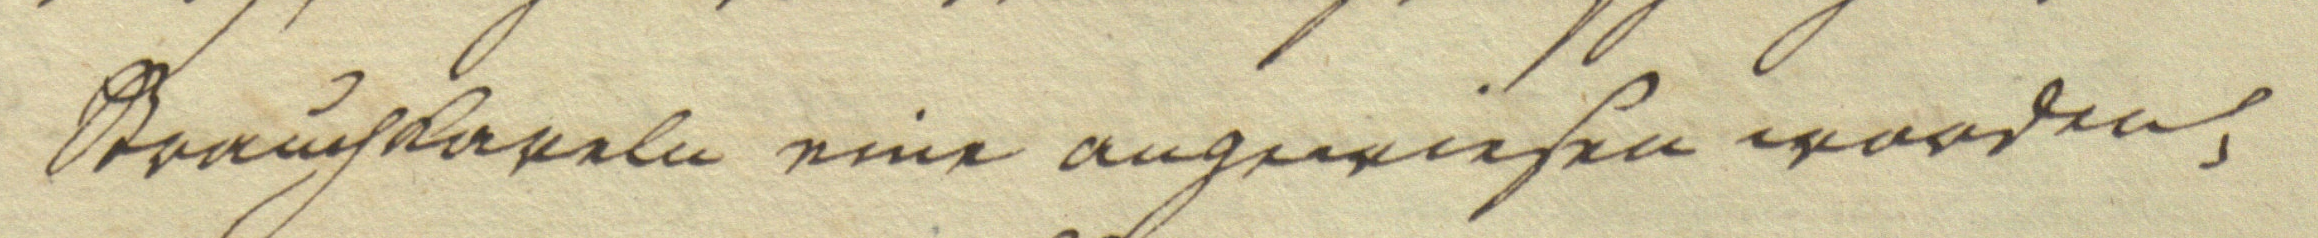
Strauchkaveln eine angewiesen worden,
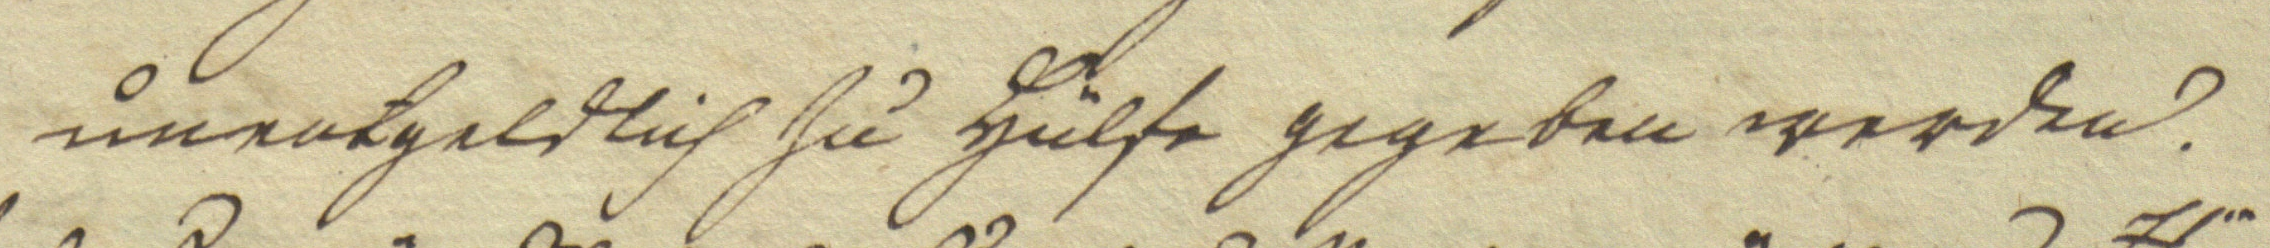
unentgeldlich zu Hülfe gegeben werden.
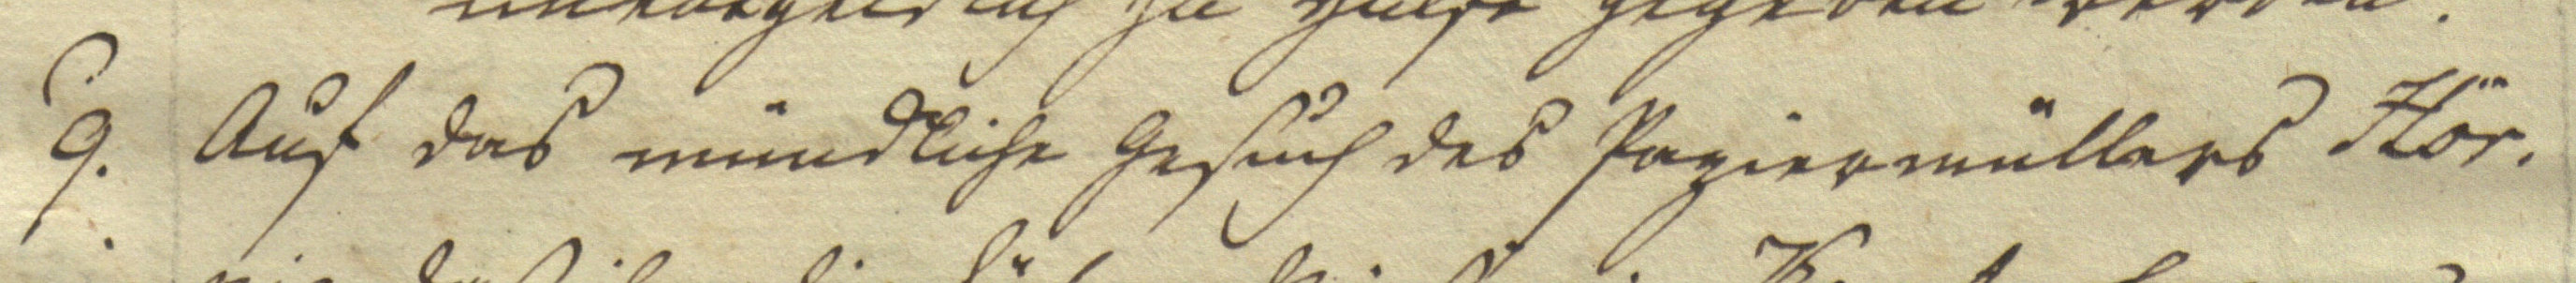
9. Auf das mündliche Gesuch des Papiermüllers Hor¬
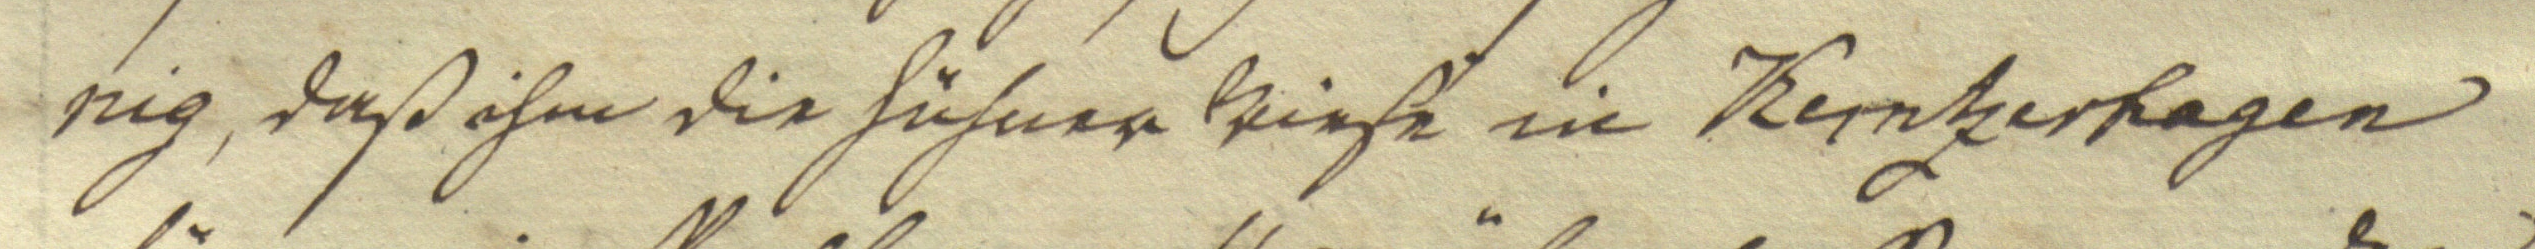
nig, daß ihm die Hühner Wiese in Kemtzerhagen
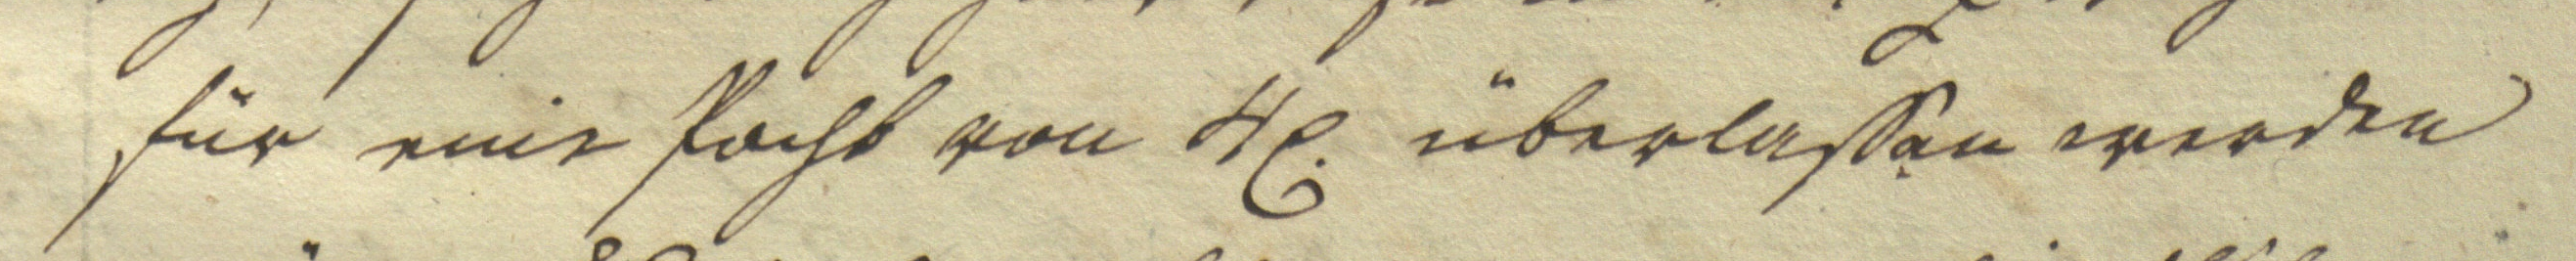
für eine Pacht von 4 l. überlassen werden
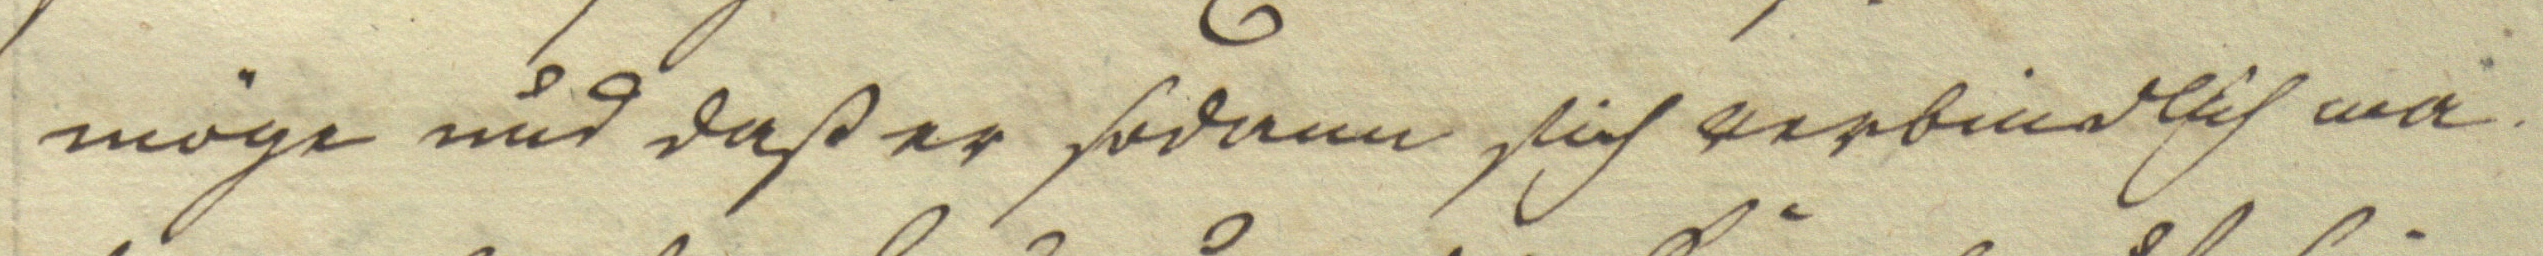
möge und daß er sodann sich verbindlich ma¬
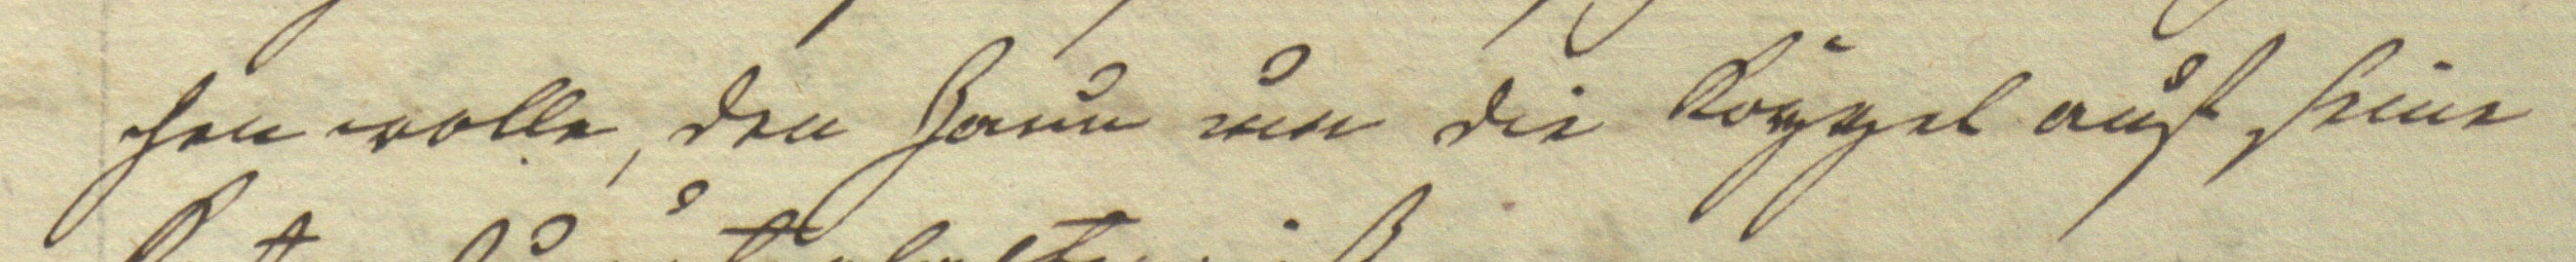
chen wolle, den Zaun um die Koppel auf seine
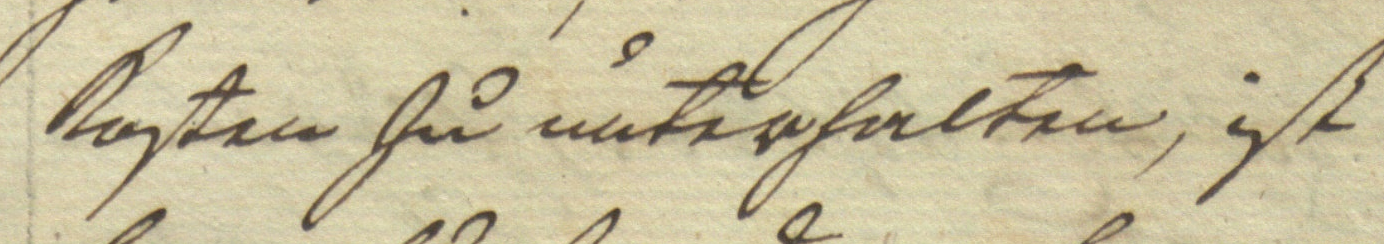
Kosten zu unterhalten, ist
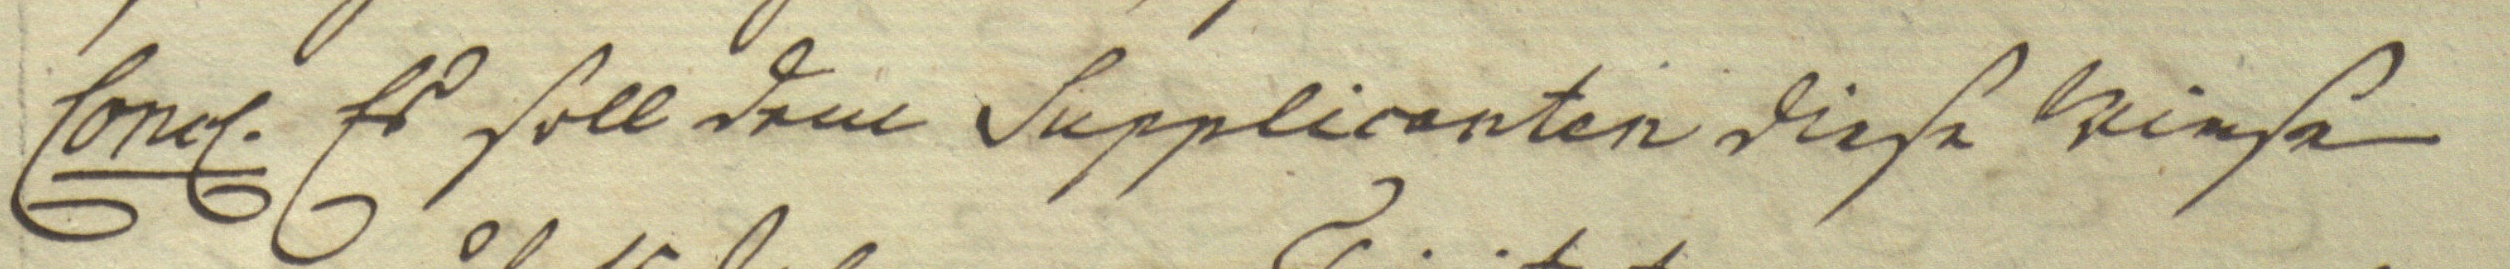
Concl. Es soll dem Supplicanten diese Wiese
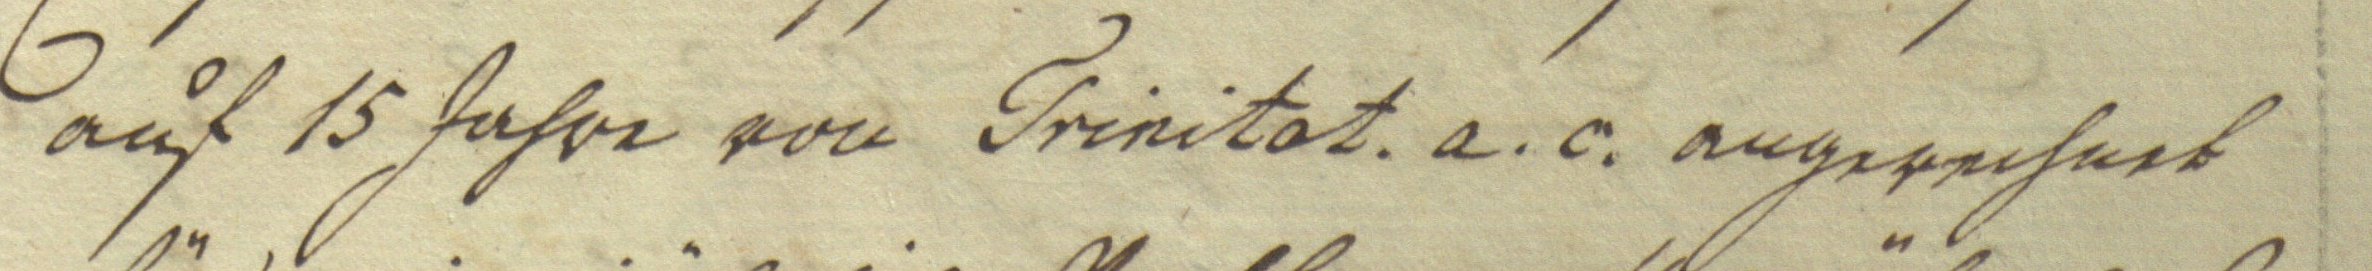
auf 15 Jahre von Trinitat. a. c. angerechnet
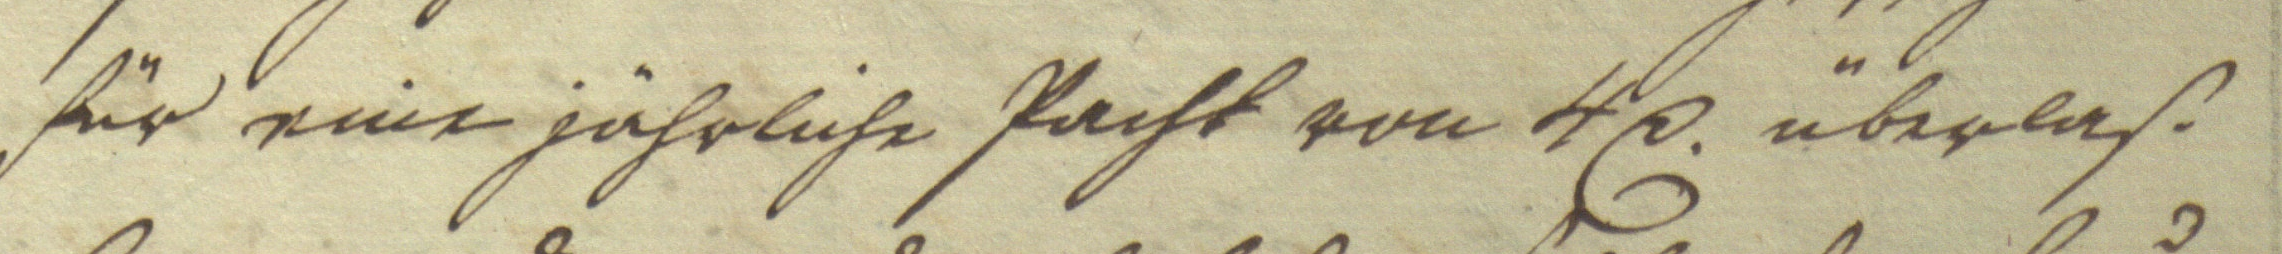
für eine jährliche Pacht von 4 l. überlas¬
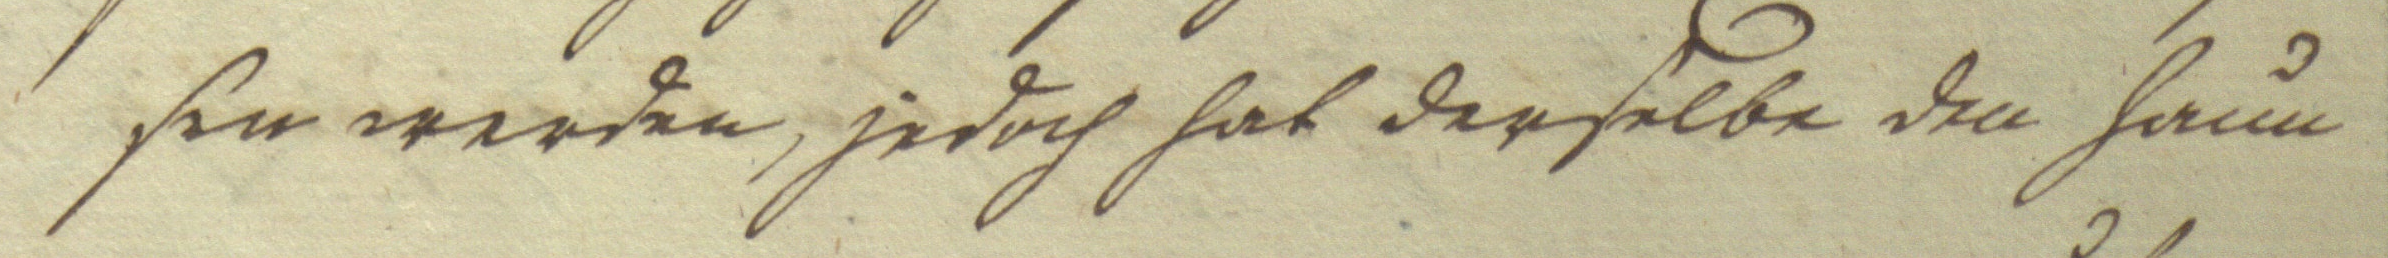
sen werden, jedoch hat derselbe den Zaun
